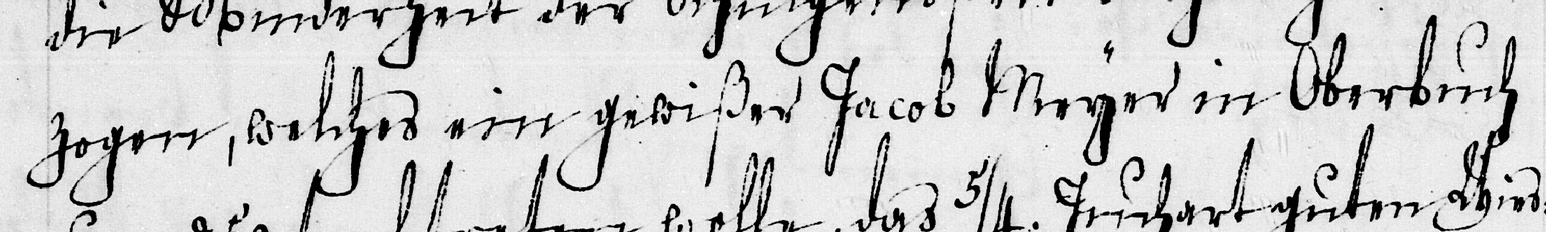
rzogen, welches ein gewißer Jacob Meyer in Oberbuch
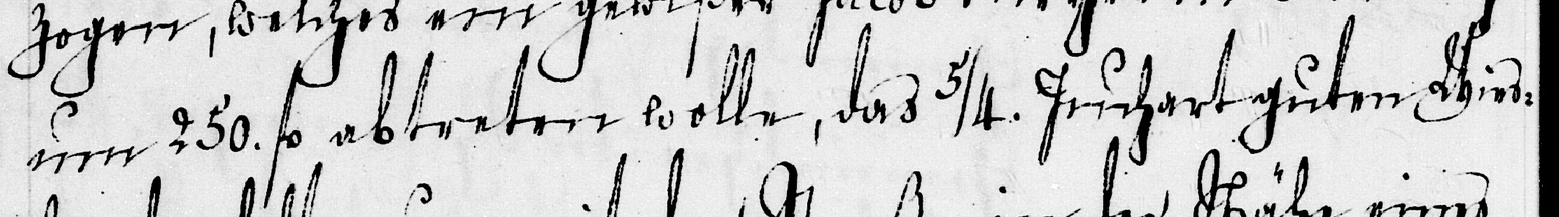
um 250. fl. abtreten wolle, das 5/4. Juchart guten Wies¬
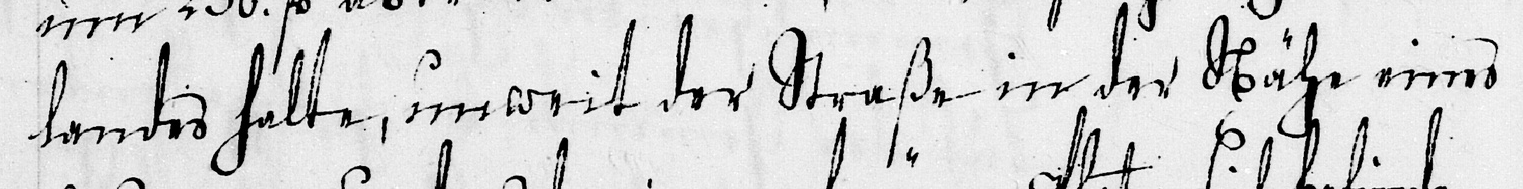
landes halte, unweit der Straße in der Nähe eines
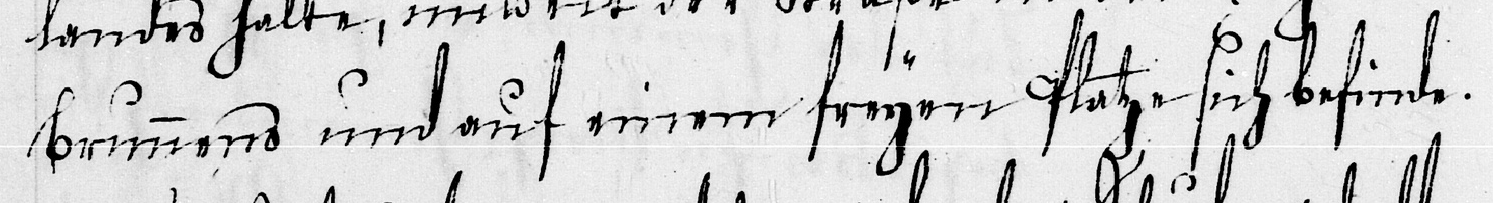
Brunnens und auf einem freyen Platze sich befinde.
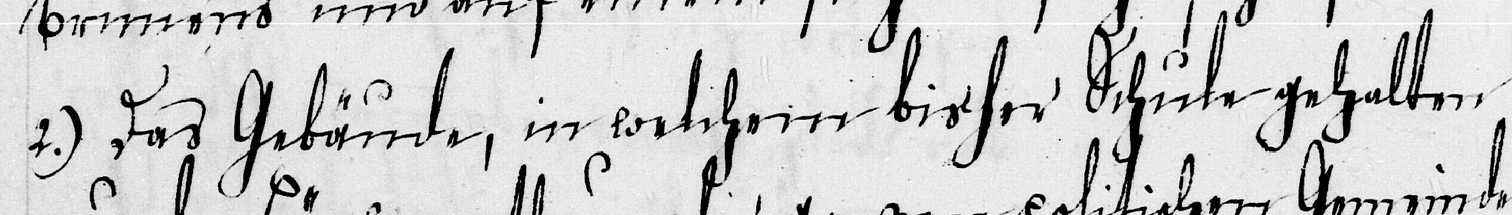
2.) Das Gebäude, in welchem bisher Schule gehalten
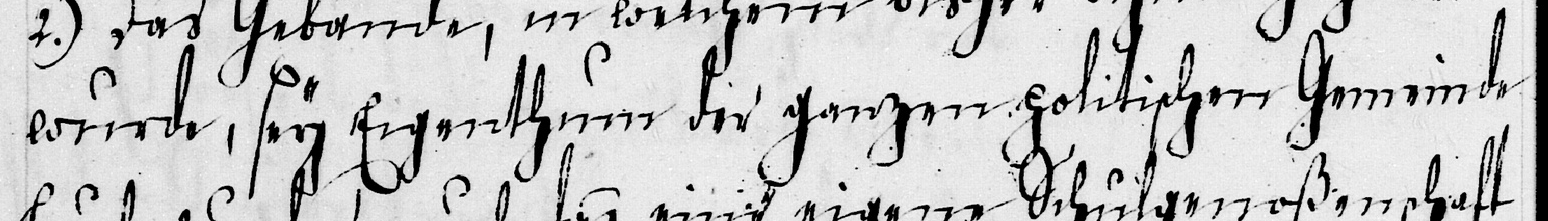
wurde, sey Eigenthum der ganzen politischen Gemeinde
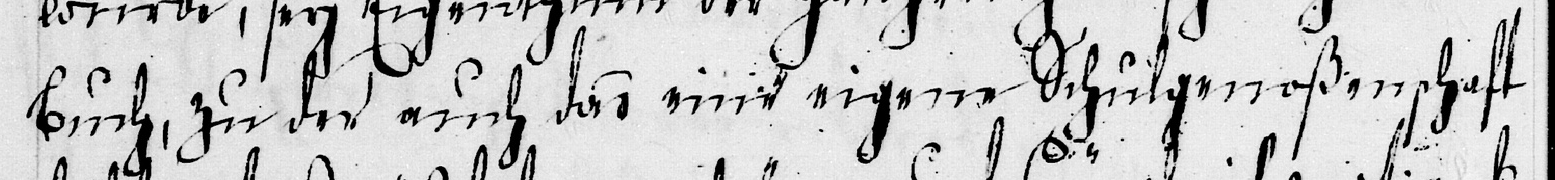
Buch, zu der auch das eine eigene Schulgenoßenschaft
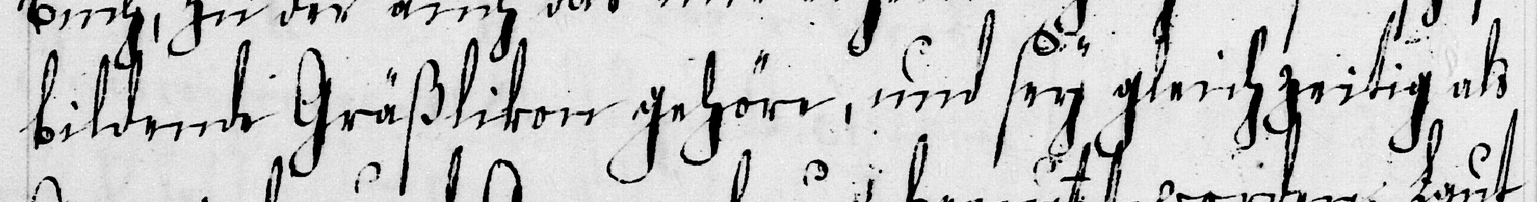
bildende Gräßlikon gehöre, und sey gleichzeitig als
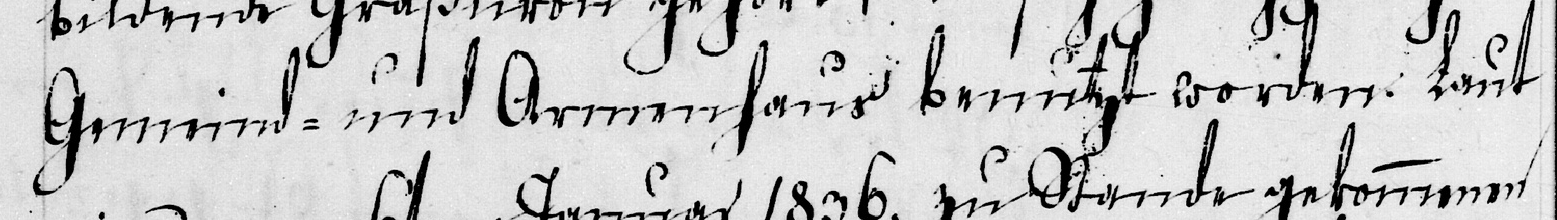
Gemeinde- und Armenhaus benutzt worden. Laut
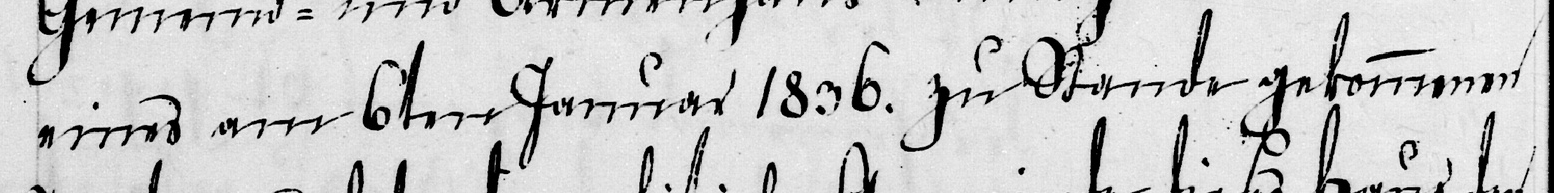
eines am 6ten Januar 1836. zu Stande gekommenen
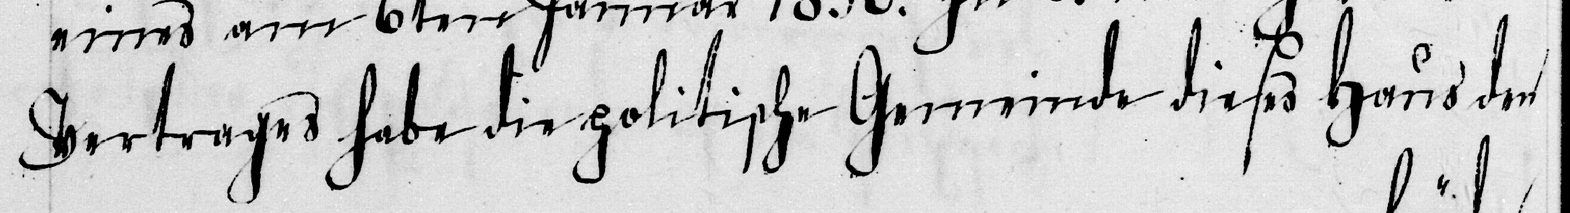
Vertrages habe die politische Gemeinde dieses Haus den
